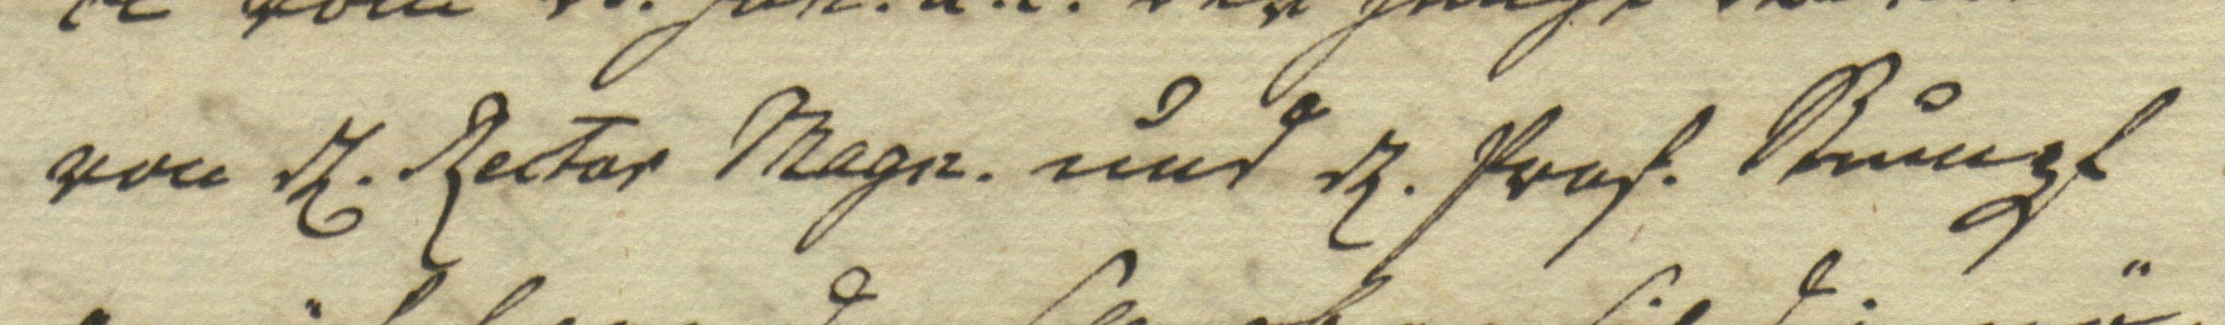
von dh. Rector Magn. und dh. Prof. Stumpf
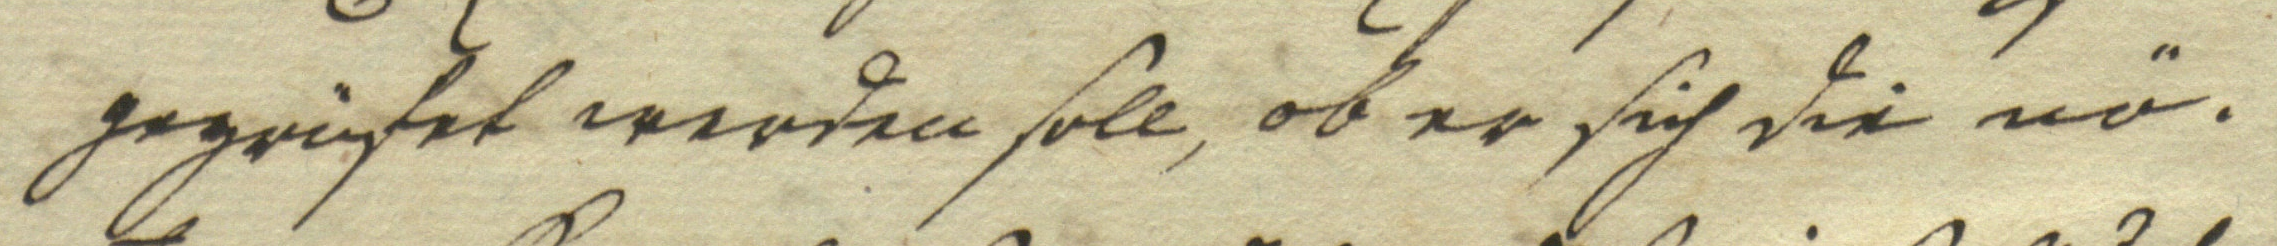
geprüfet werden soll, ob er sich die nö¬
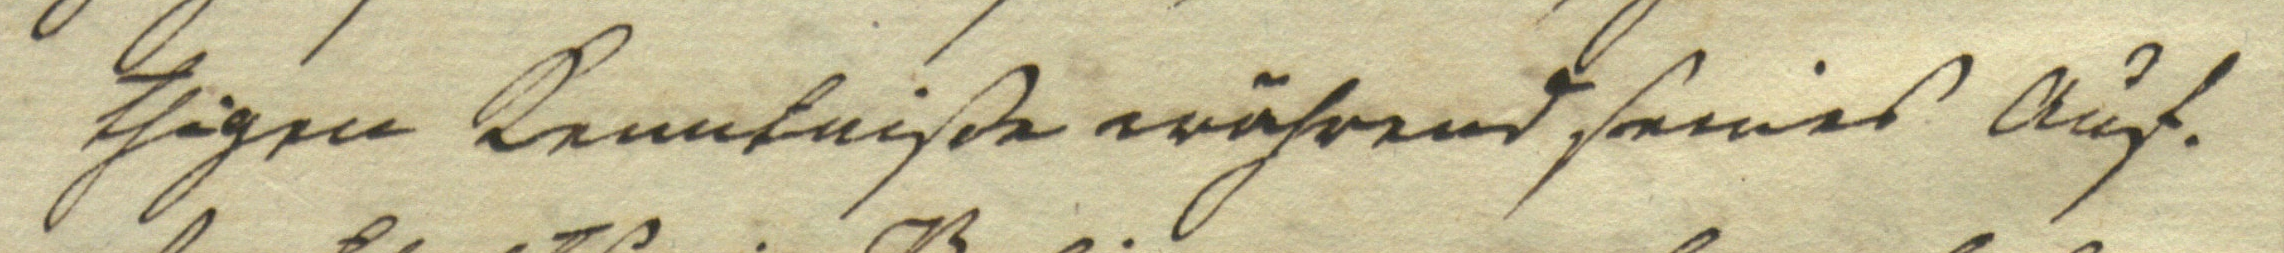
thigen Kenntnisse während seines Auf¬
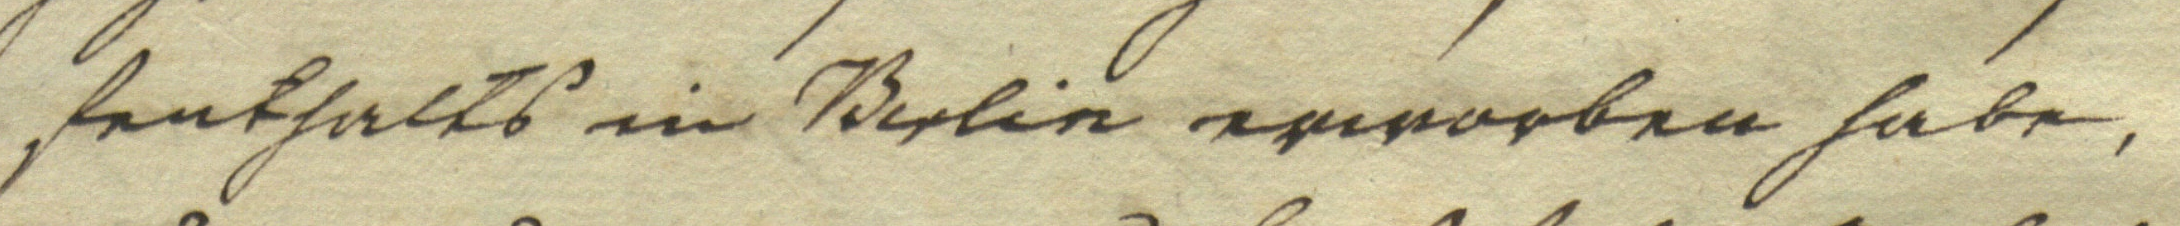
fenthalts im Berlin erworben habe,
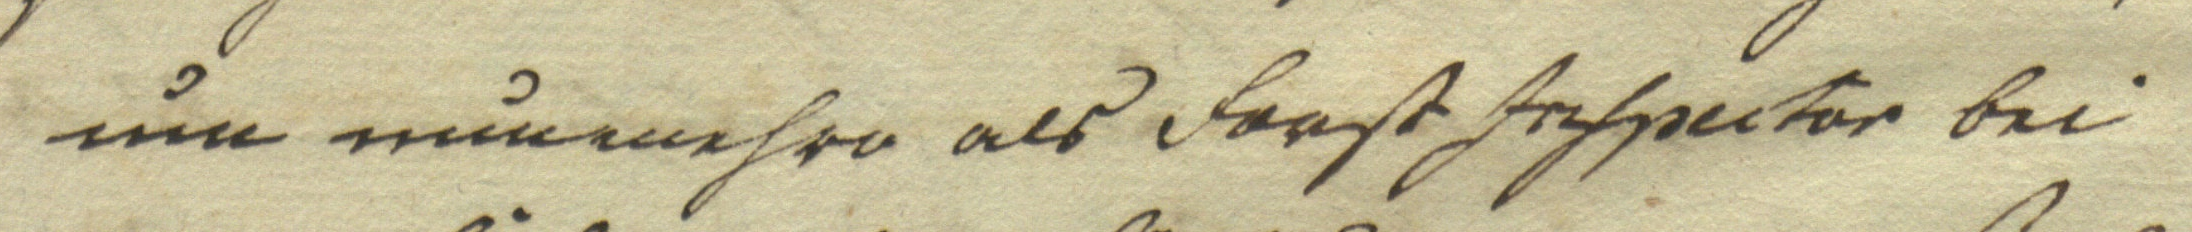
um nunmehro als Forst Inspector bei
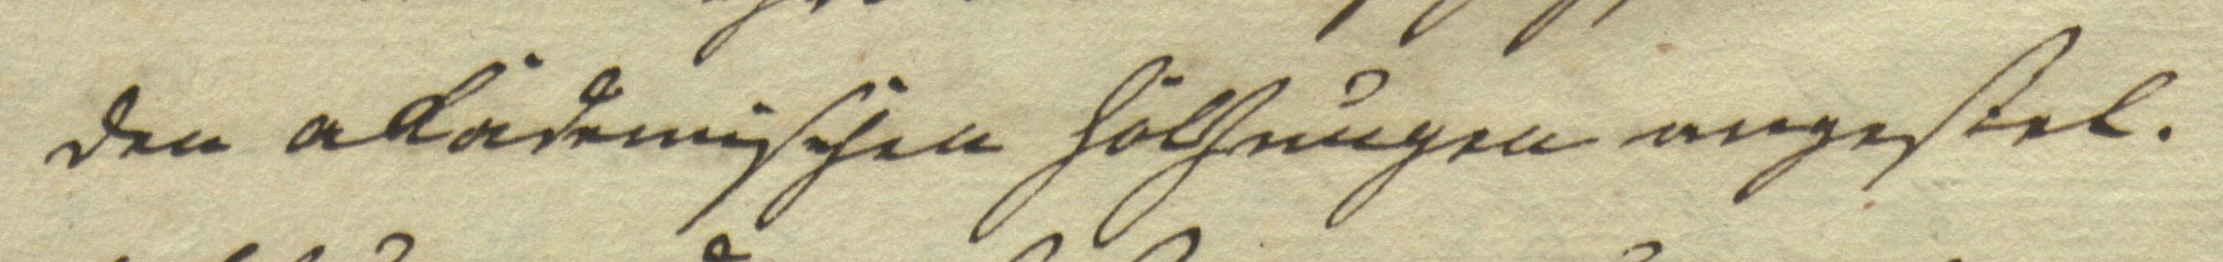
den akademischen Hölzungen angestel¬
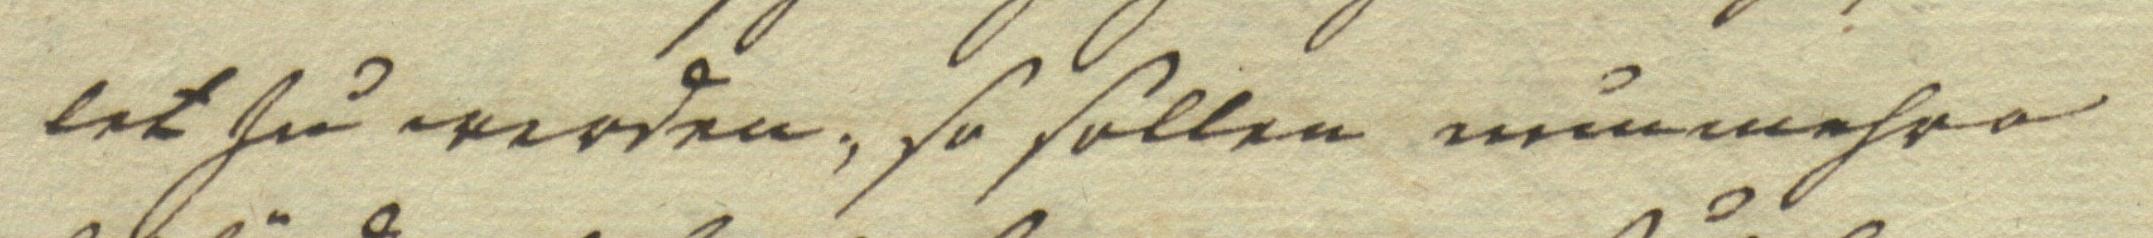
let zu werden, so sollen nunmehro
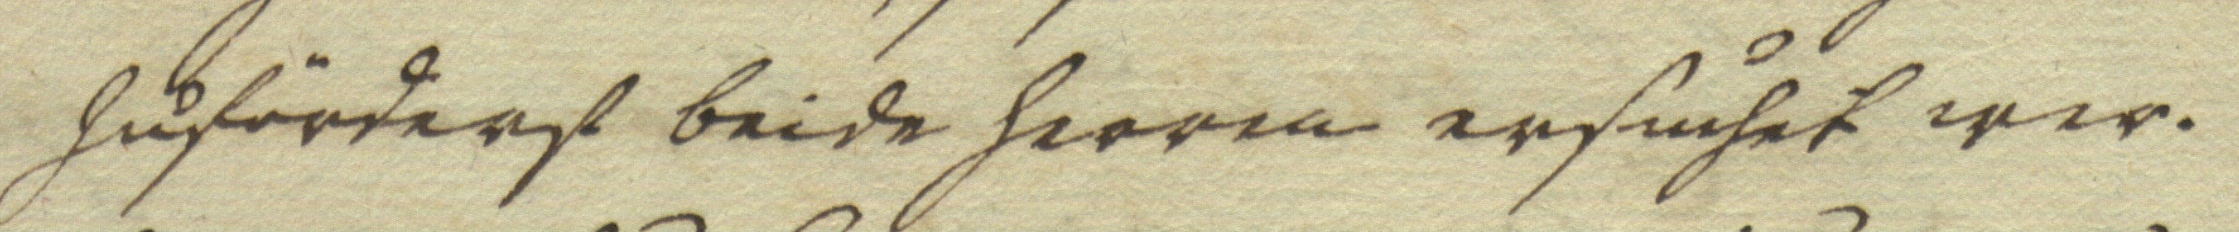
zuförderst beide Herren ersuchet wer¬
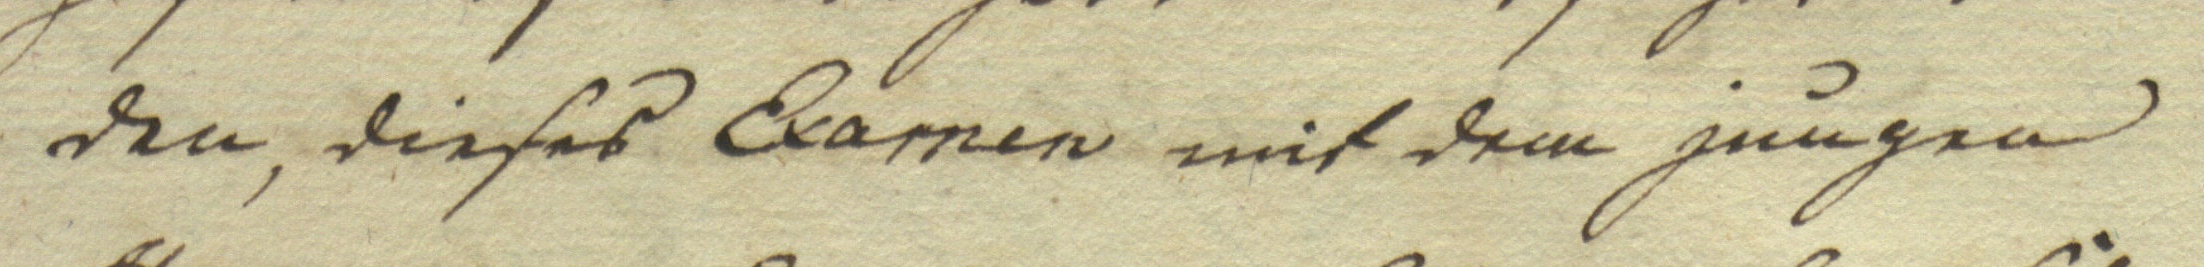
den, dieses Examen mit dem jungen
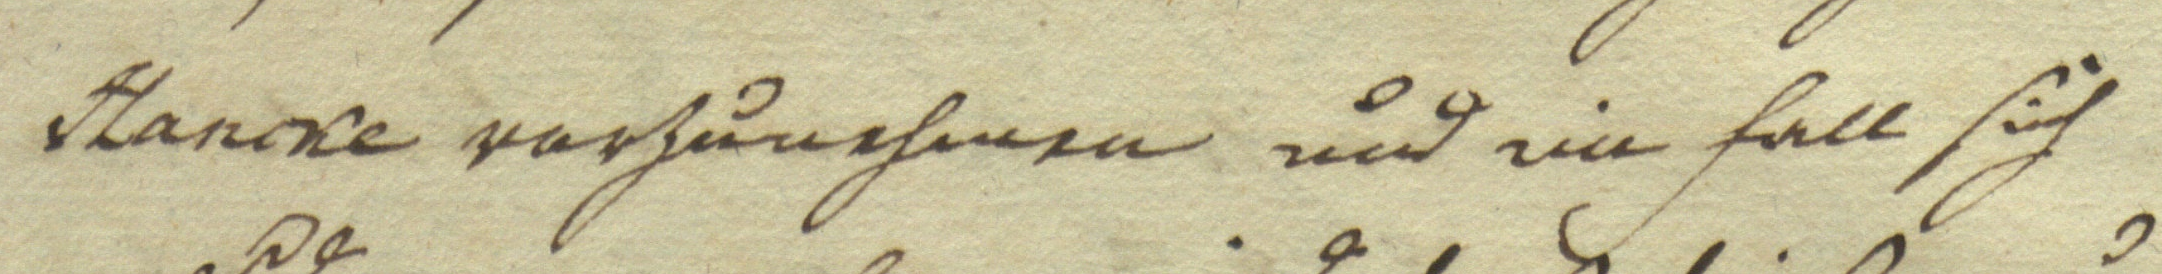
Hancke vorzunehmen und im Fall sich
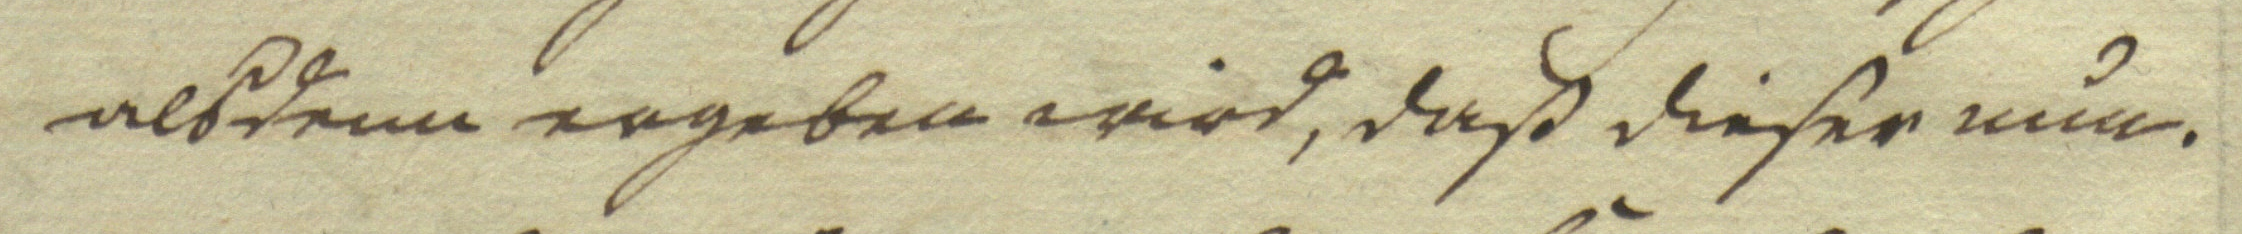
alsdenn ergeben wird, daß dieser nun¬
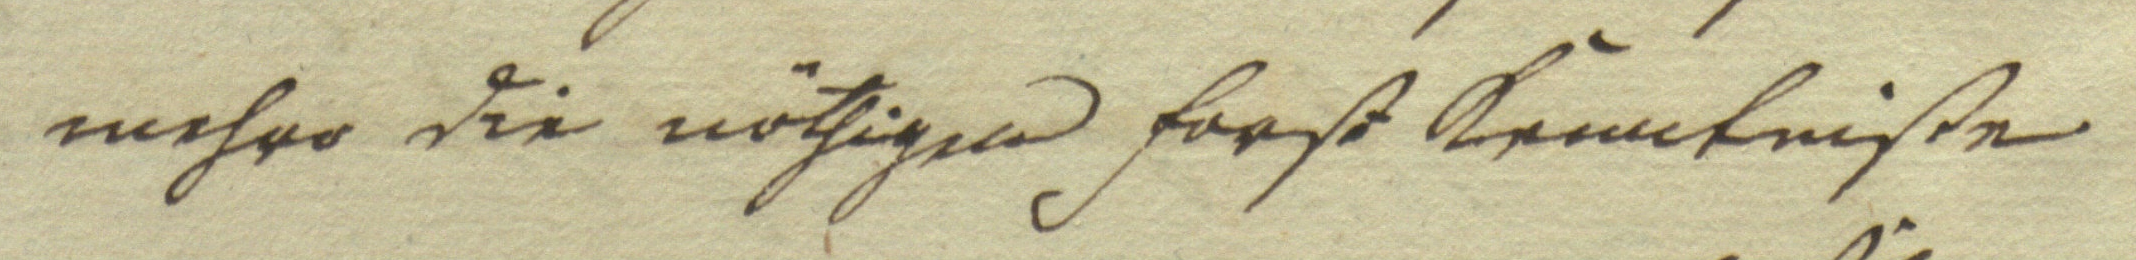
mehro die nöthigen Forst Kenntnisse
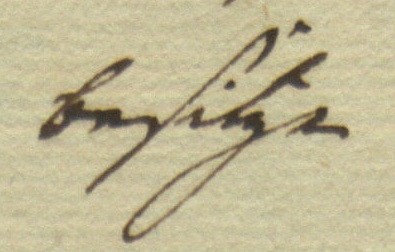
besitze
